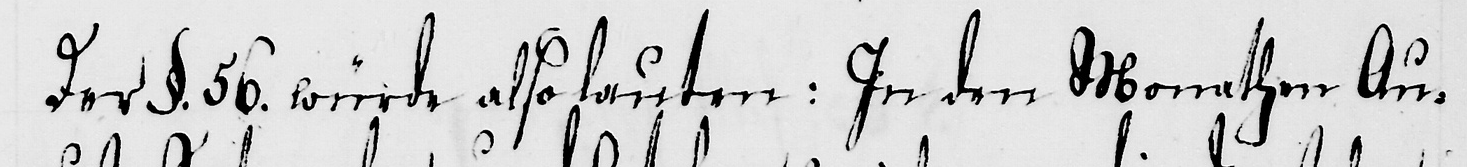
Der §. 56. würde also lauten: In den Monathen Au¬
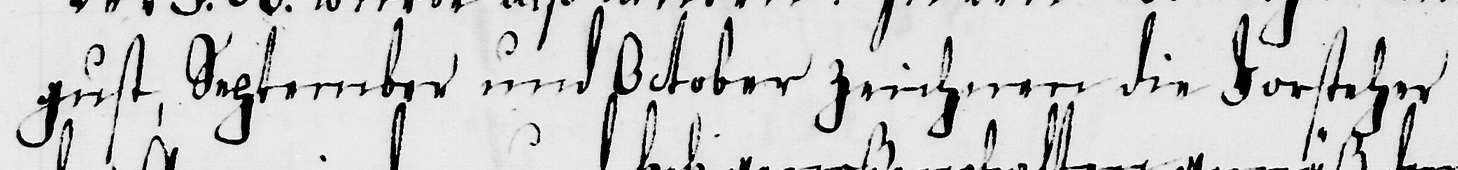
gust, September und October zeichnen die Vorsteher
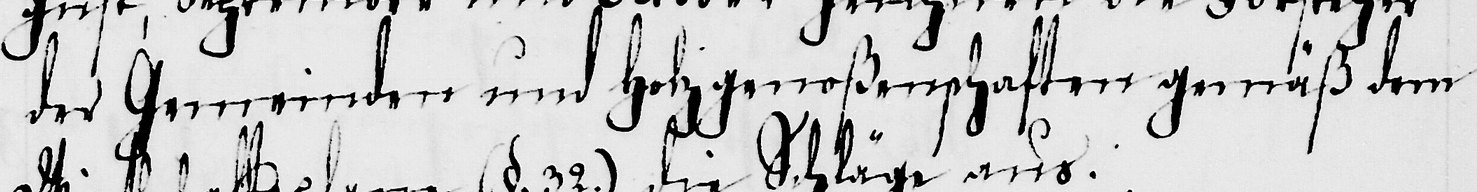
der Gemeinden und Holzgenoßenschaften gemäß dem
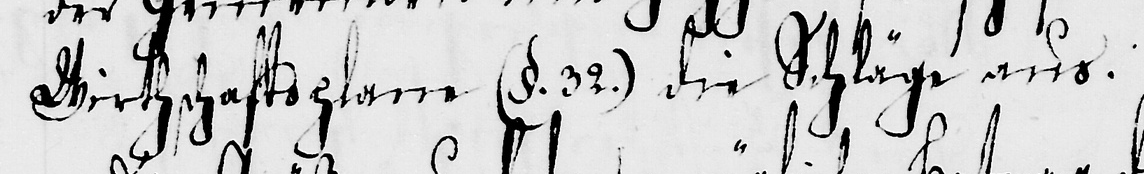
Wirthschaftsplane (§. 32.) die Schläge aus.
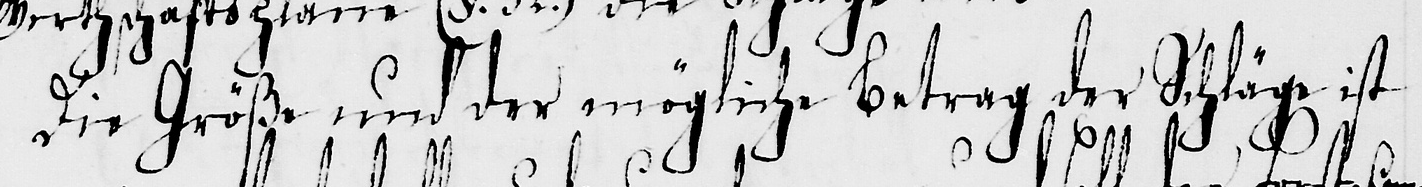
Die Größe und der mögliche Betrag der Schläge ist
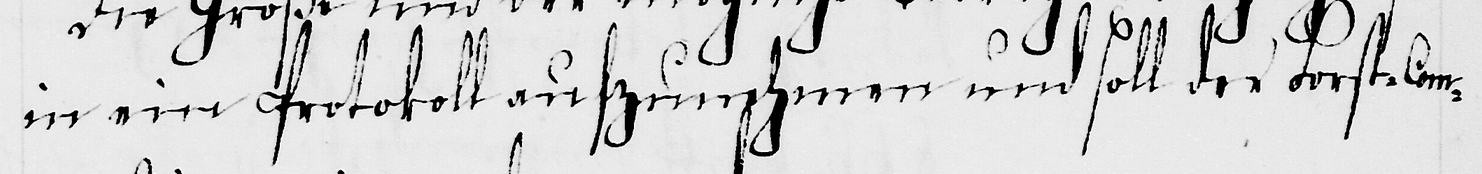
in ein Protokoll aufzunehmen und soll der Forst-Com¬
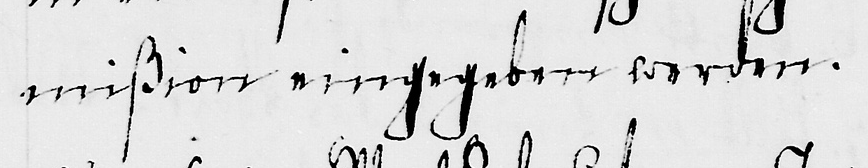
mißion eingegeben werden.
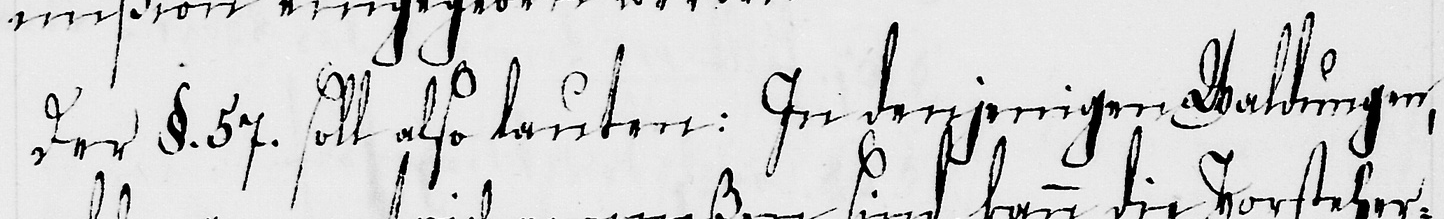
Der §. 57. soll also lauten: In denjenigen Waldungen,
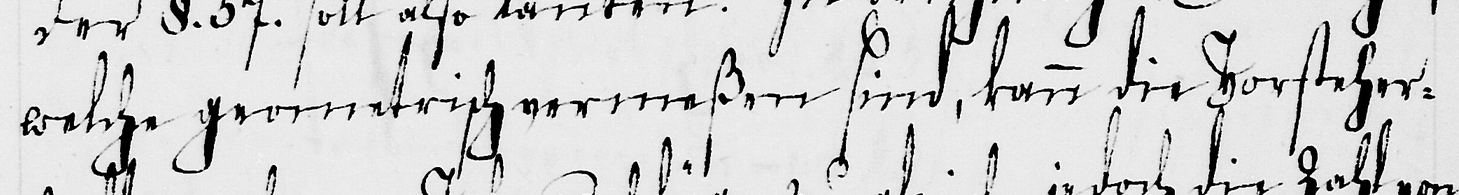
welche geometrisch vermeßen sind, kann die Vorstehers¬
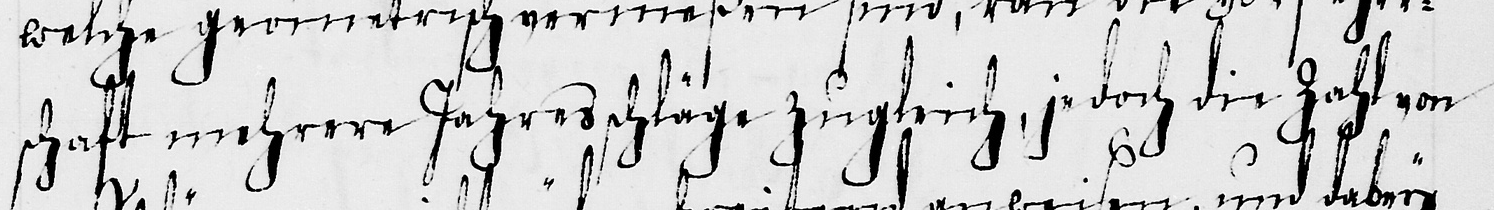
chaft mehrere Jahresschläge zugleich, jedoch die
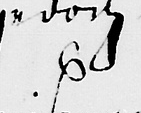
Zahl
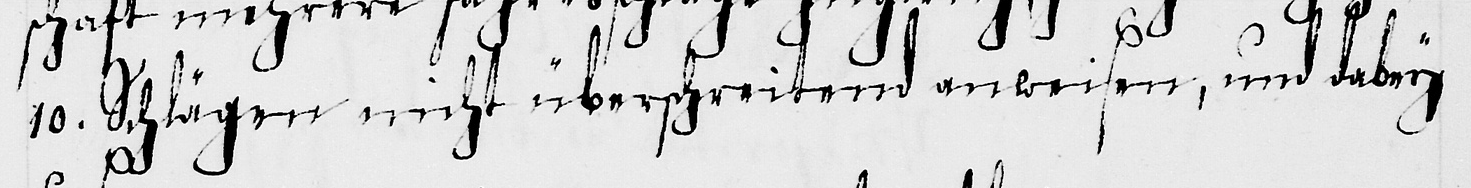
10. Schlägen nicht überschreitend anweisen, und dabey
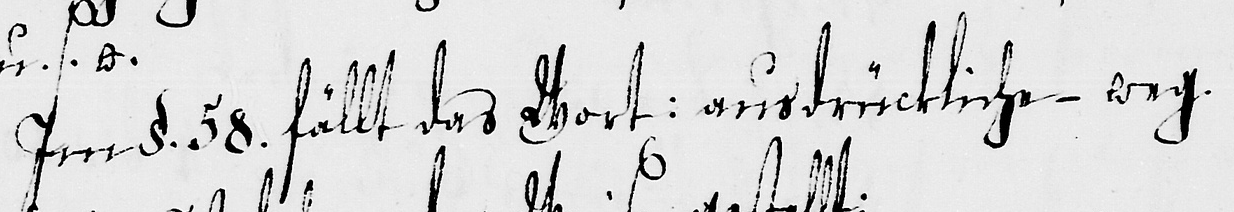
In §. 58. fällt das Wort: ausdrückliche – weg.
